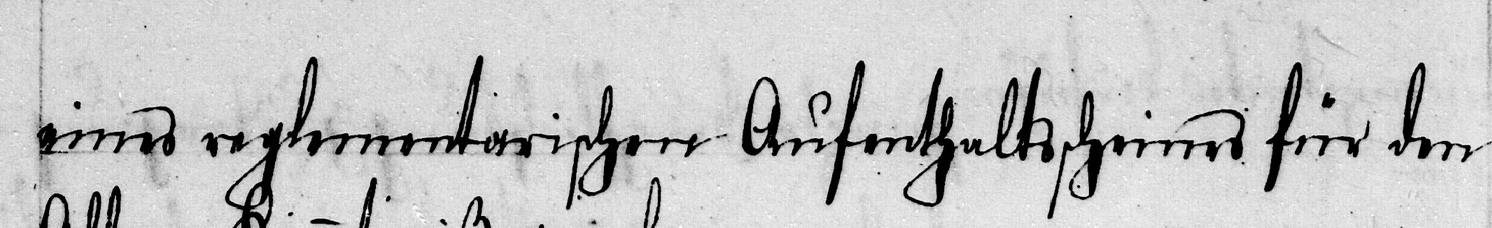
eines reglementarischen Aufenthaltsscheines für den
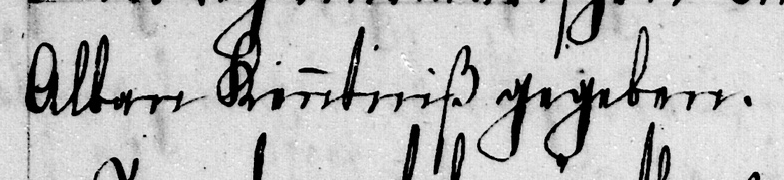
Alban Kenntniß gegeben.
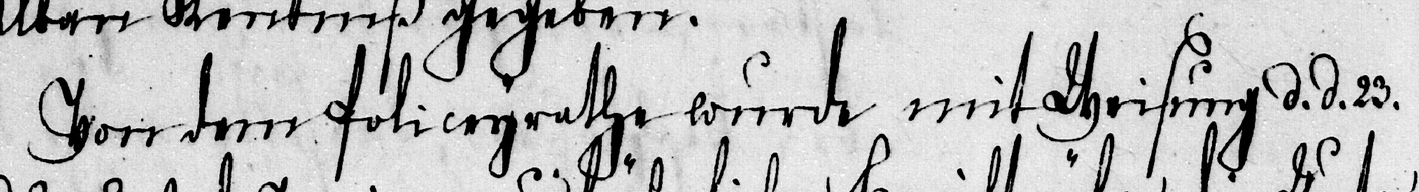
Von dem Policeyrathe wurde mit Weisung d. d.
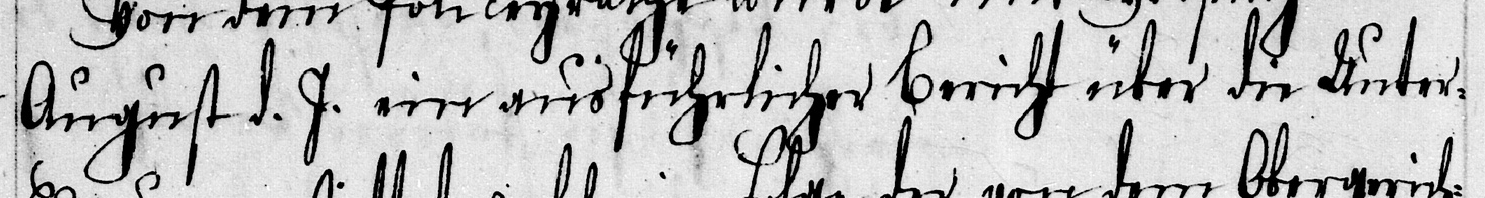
August d. J. ein ausführlicher Bericht über die Unter¬
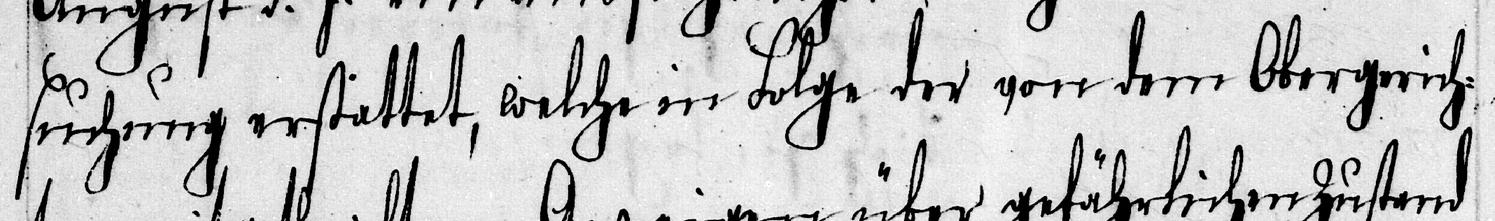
suchung erstattet, welche in Folge der von dem Obergerich¬
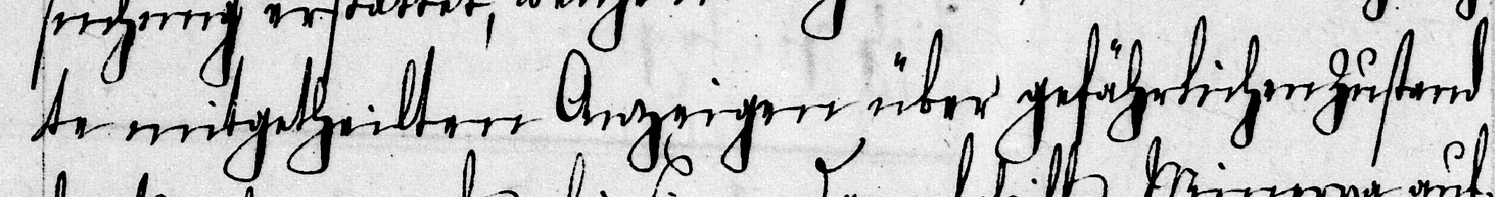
te mitgetheilten Anzeigen über gefährlichen Zustand
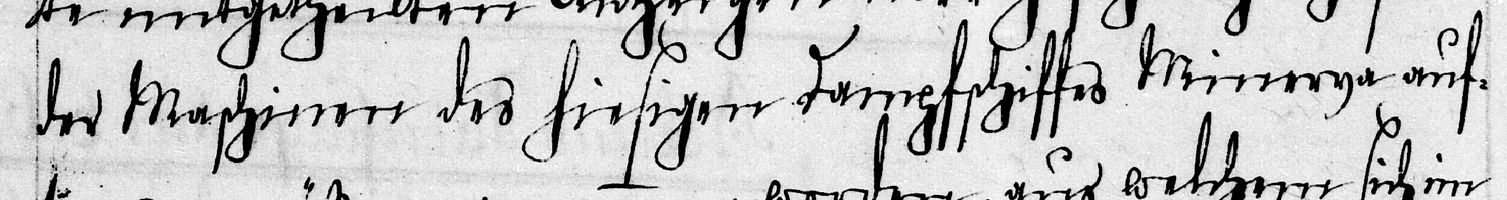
der Maschinen des hiesigen Dampfschiffes Minerva auf¬
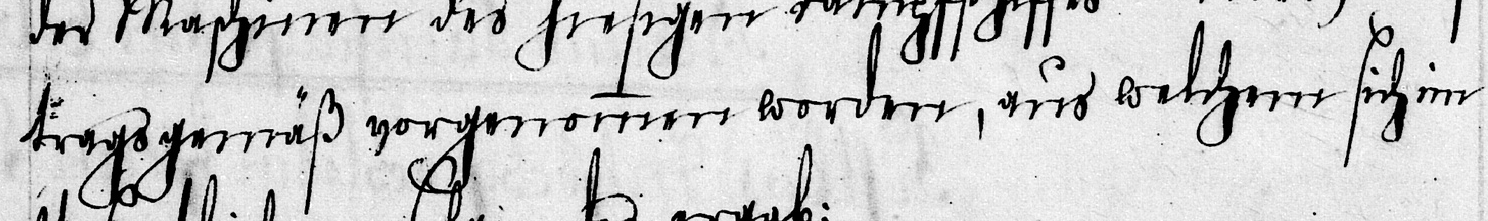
tragsgemäß vorgenommen worden, aus welchem sich im
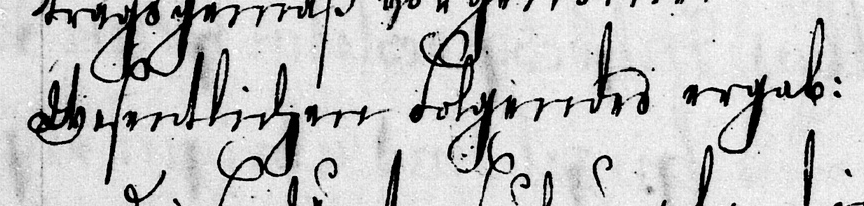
Wesentlichen Folgendes ergab:
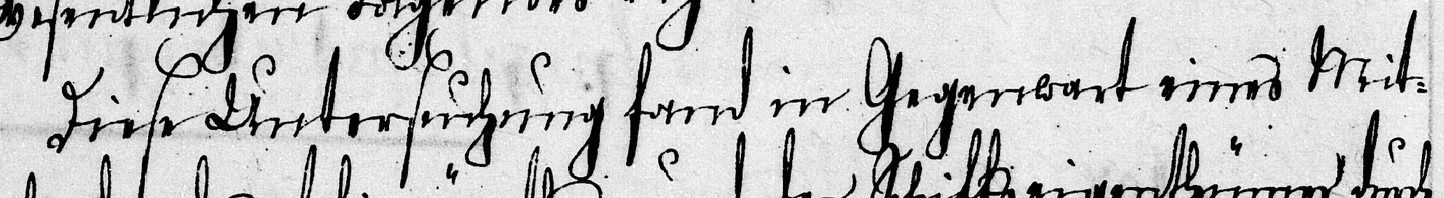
Diese Untersuchung fand in Gegenwart eines Mit¬
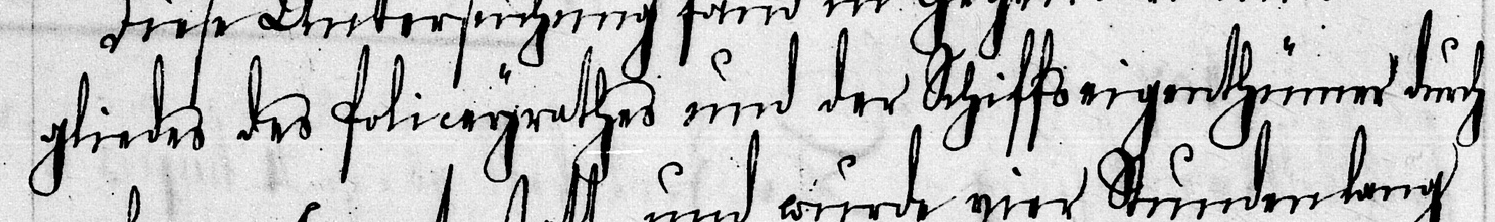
gliedes des Policeyrathes und der Schiffseigenthümer dur¬
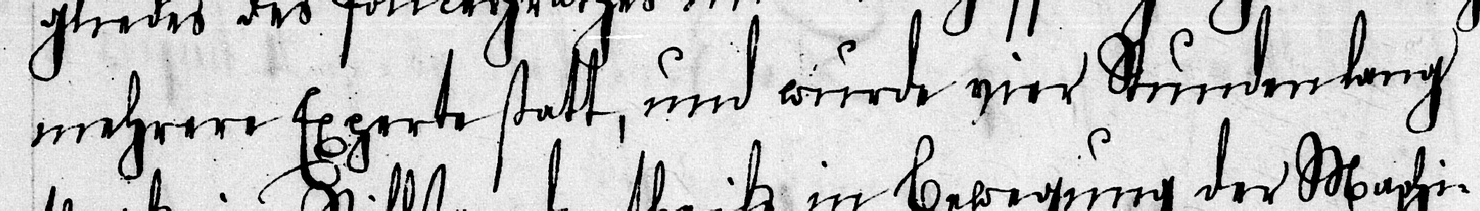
mehrere Experte statt, und wurde vier Stunden lang
